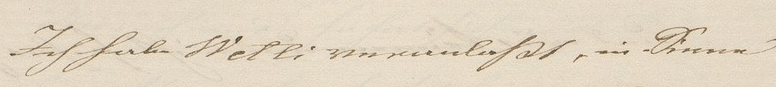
Ich habe Wetli veranlaßt, im Sinne
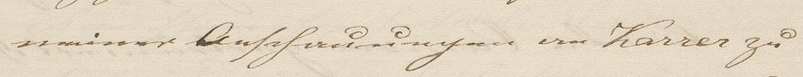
meiner Anschauungen an Karrer zu
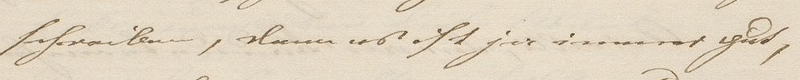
schreiben, denn es ist ja immer gut,
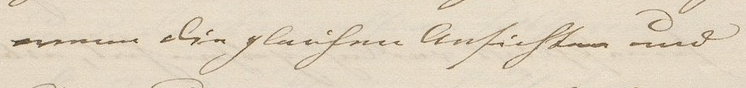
wenn die gleichen Ansichten und
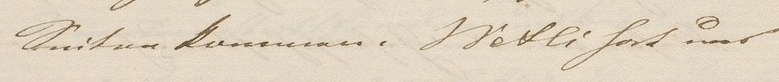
Seiten kommen. Wetli hat uns
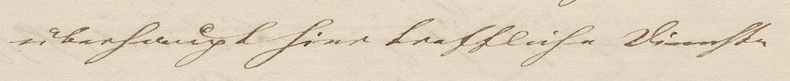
überhaupt hier treffliche Dienste
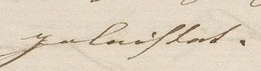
geleistet.
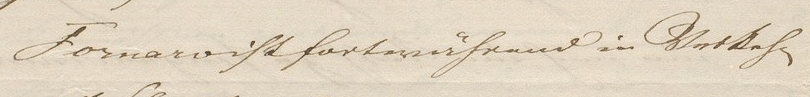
Fornaro ist fortwährend in Verkehr
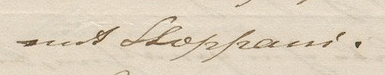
mit Stoppani.
